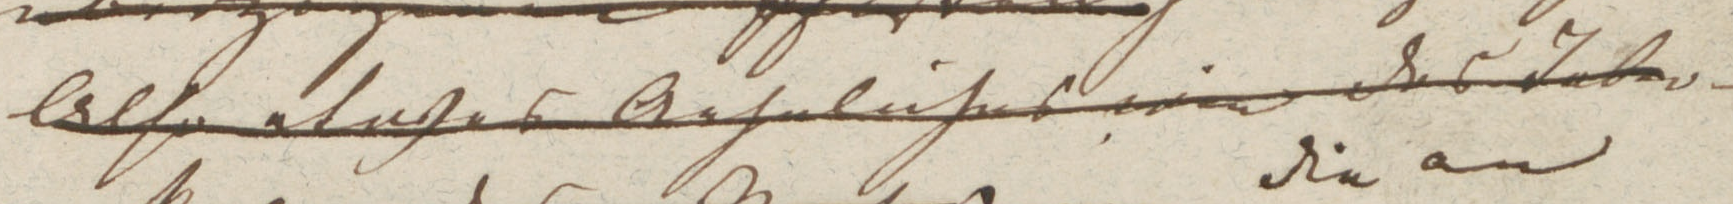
Also etwas Aehnliches wie das Taber-
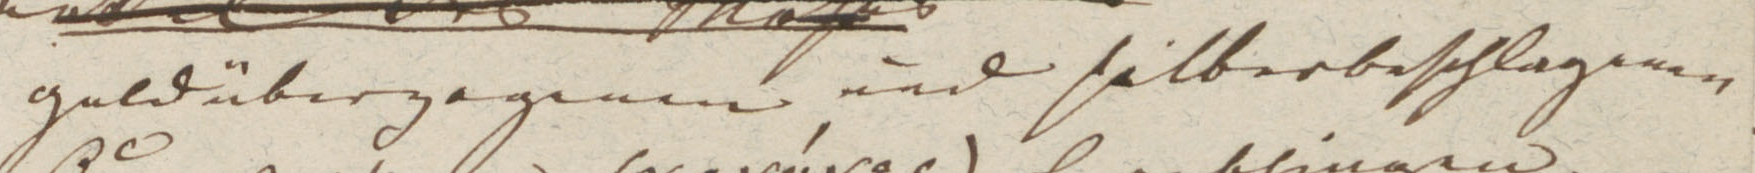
goldüberzogenen und silberbeschlagenen
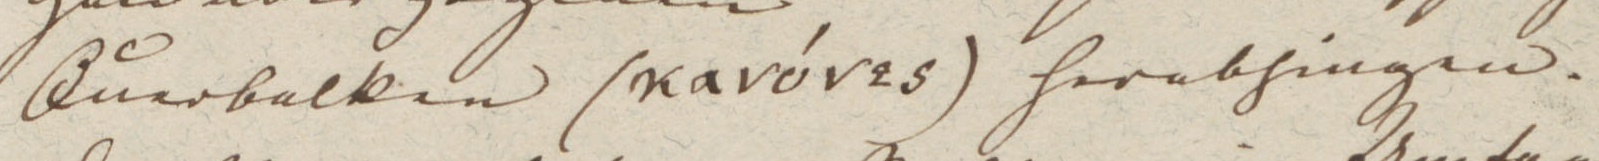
Querbalken (κανόνες) herabhingen.
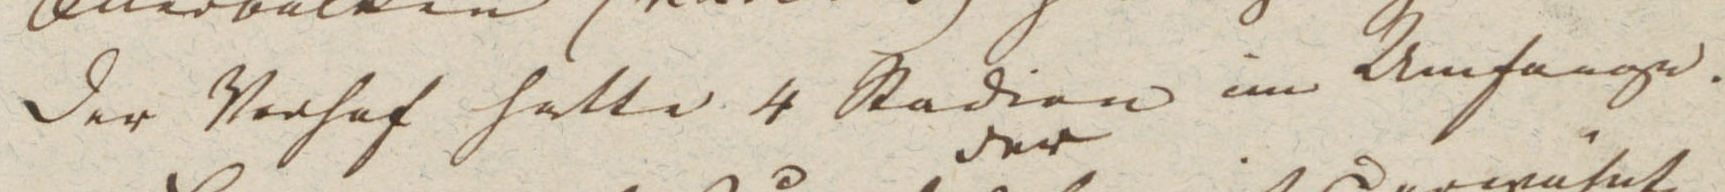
Der Vorhof hatte 4 Stadien im Umfange.
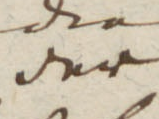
% Chares in
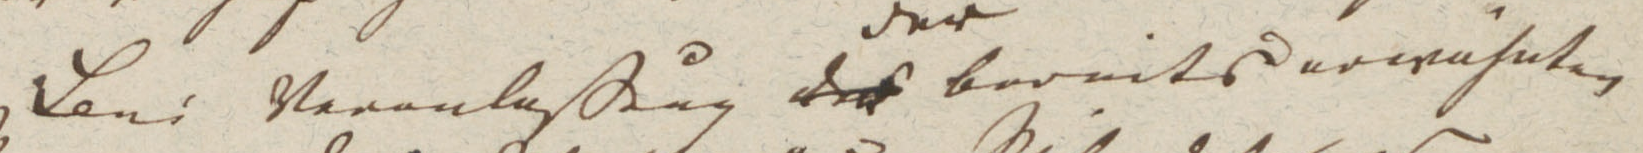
Bei Veranlassung des der bereits erwähnten
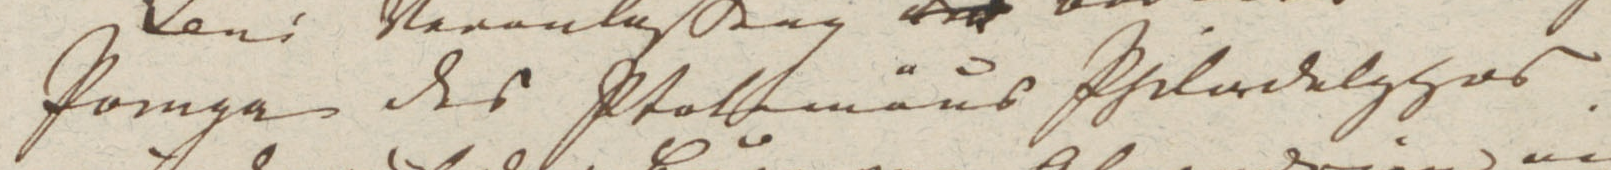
Pompa des Ptolemäus Philadelphos
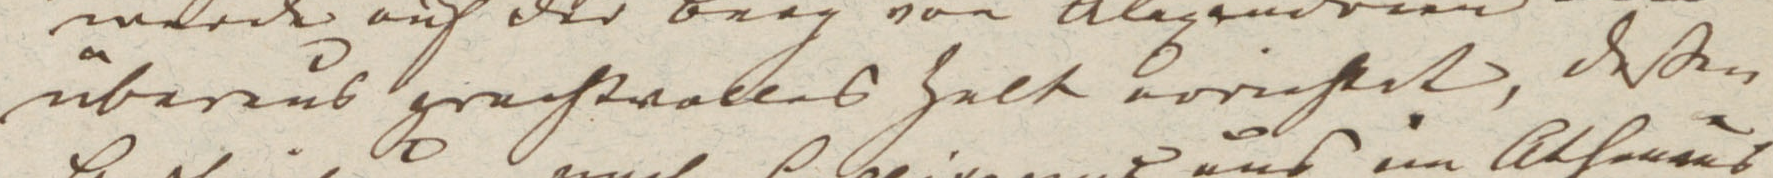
überaus prachtvolles Zelt errichtet, dessen
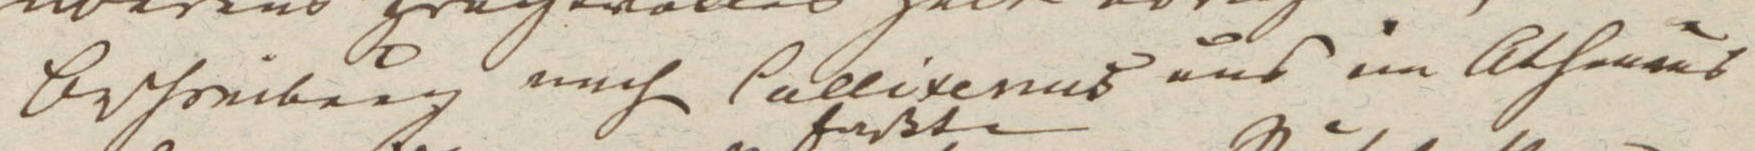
Beschreibung nach Callixenus uns im Athenäus
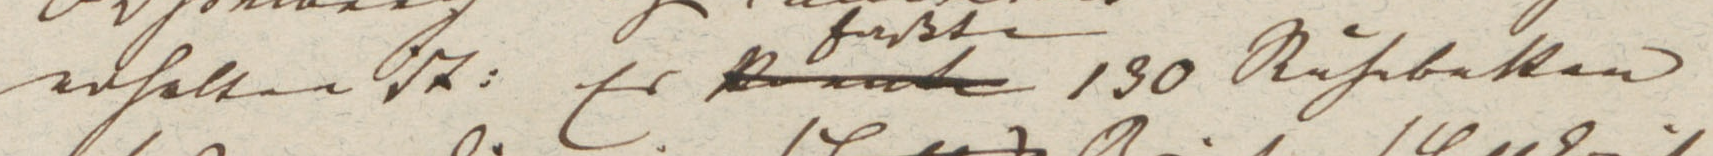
erhalten ist: Es konnte fasste 130 Ruhebetten
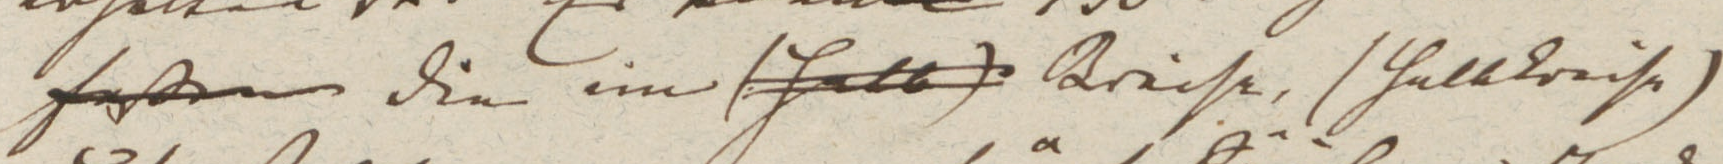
fassen die im (Halb) Kreise, (Halbkreise)
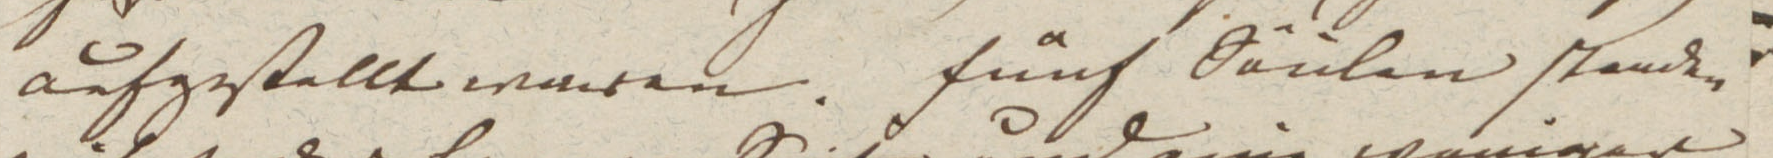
aufgestellt waren. Fünf Säulen standen
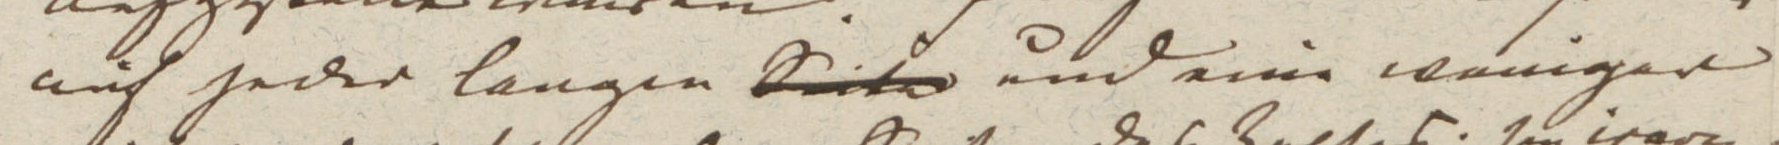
auf jeder langen Seite und eine weniger
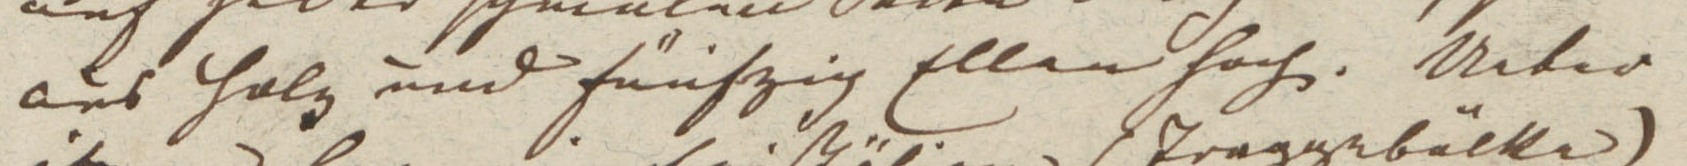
aus Holz und fünfzig Ellen hoch. Ueber
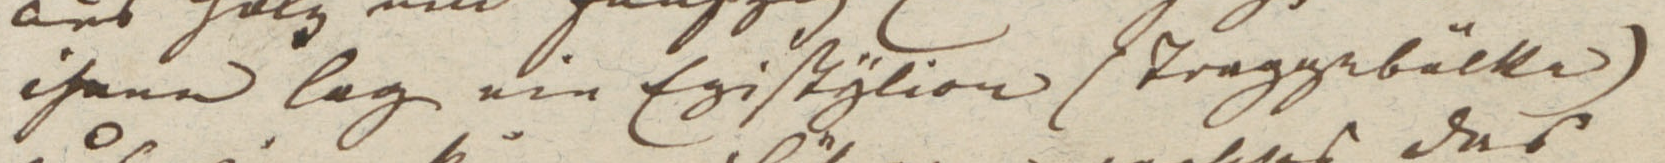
ihnen lag ein Epistylion (Traggebälke)
